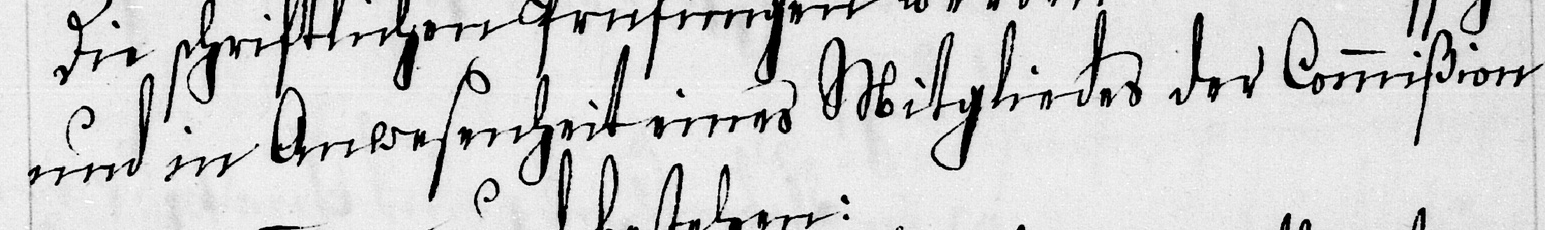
und in Anwesenheit eines Mitgliedes der Commißion
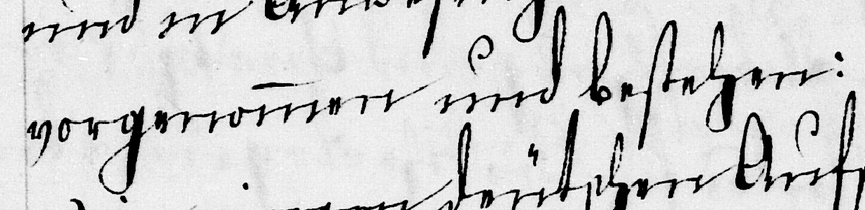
vorgenommen und bestehen:
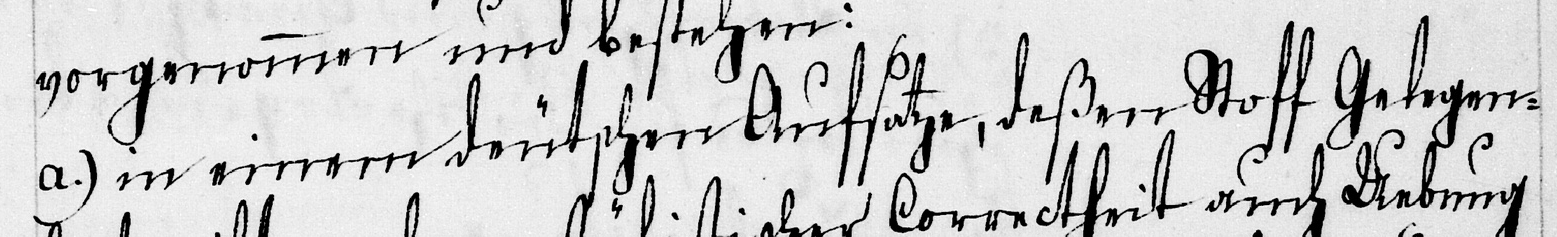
a.) in einem deutschen Aufsatze, deßen Stoff Gelegen¬
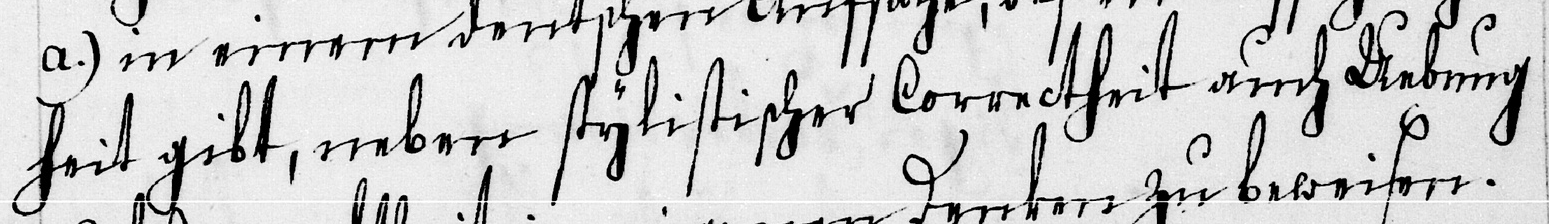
heit gibt, neben stylistischer Correctheit auch Uebung
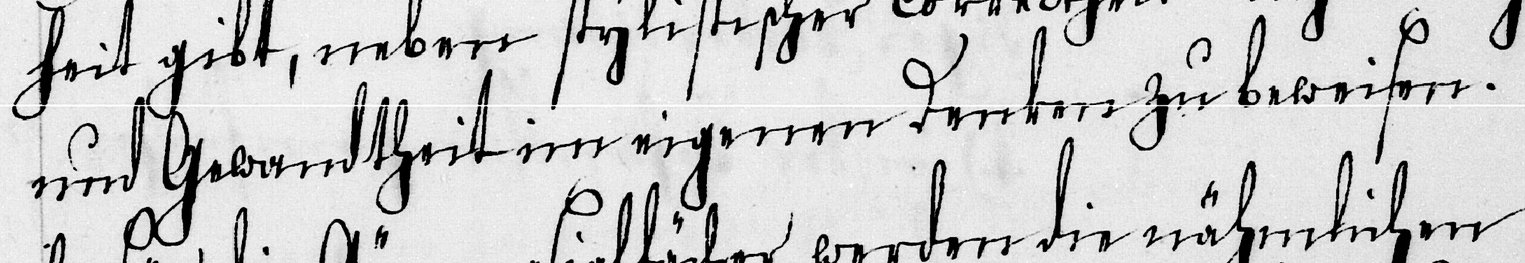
und Gewandtheit im eigenen Denken zu beweisen.
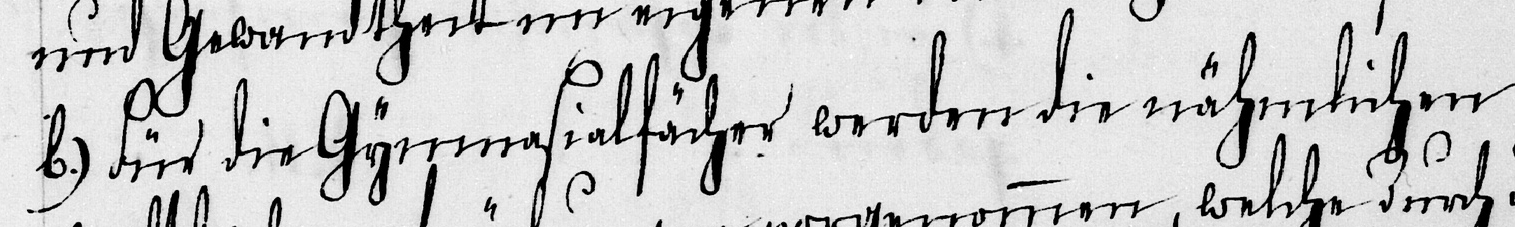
b.) Für die Gymnasialfächer werden die nähmlichen
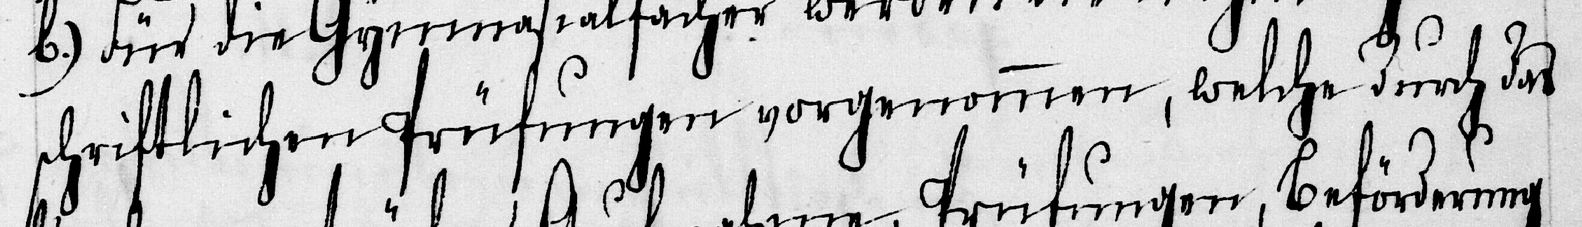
schriftlichen Prüfungen vorgenommen, welche durch das
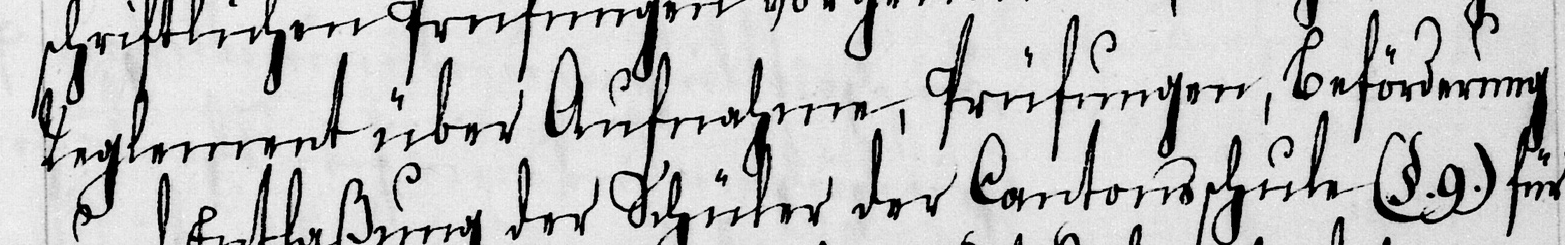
Reglement über Aufnahme, Prüfungen, Beförderung
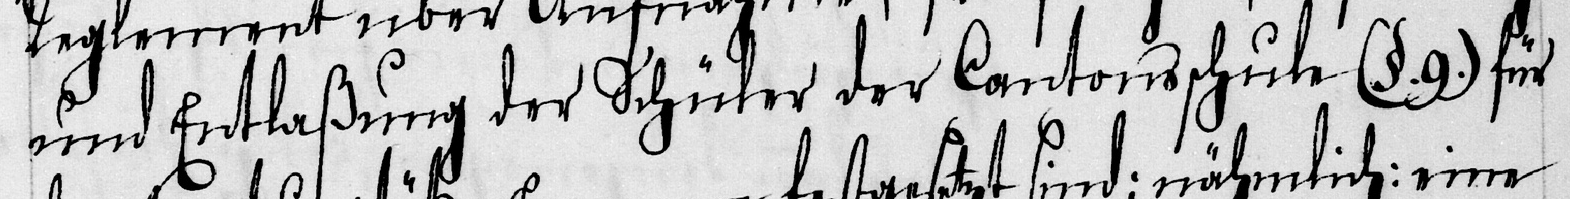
und Entlaßung der Schüler der Cantonsschule (§. 9.) für
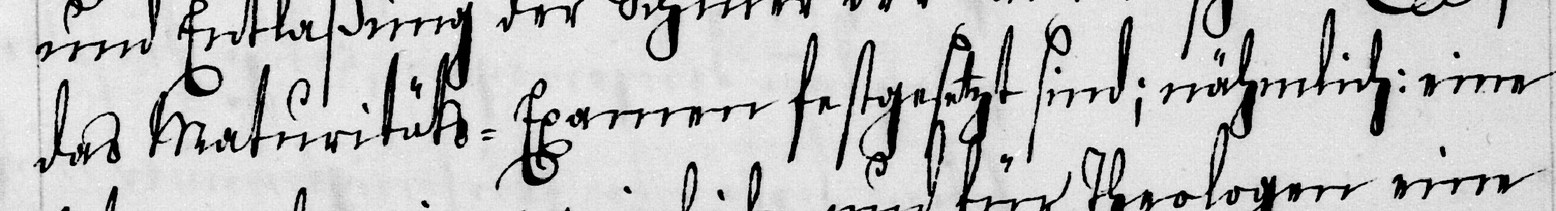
das Maturitäts-Examen festgesetzt sind; nähmlich: eine
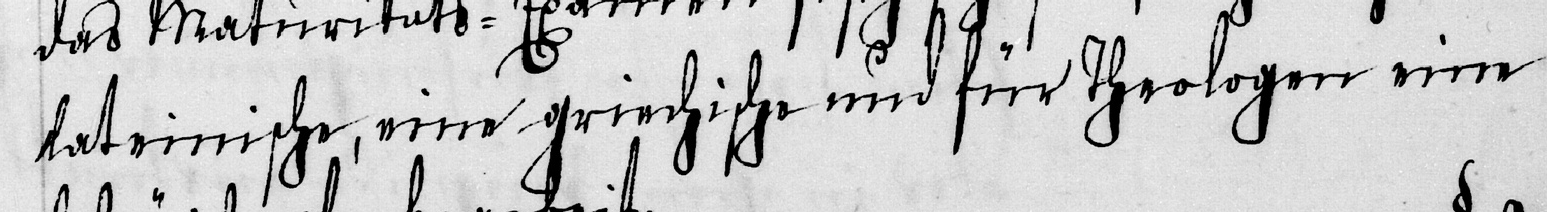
lateinische, eine griechische und für Theologen eine
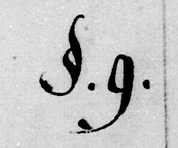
§. 7.
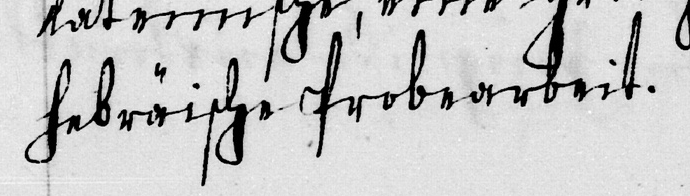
hebräische Probearbeit.
